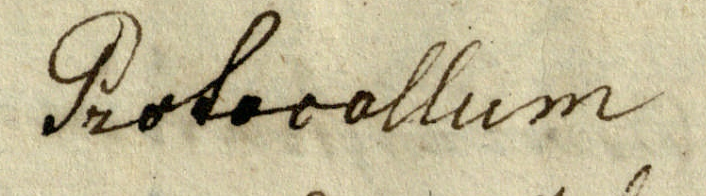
Protocollum
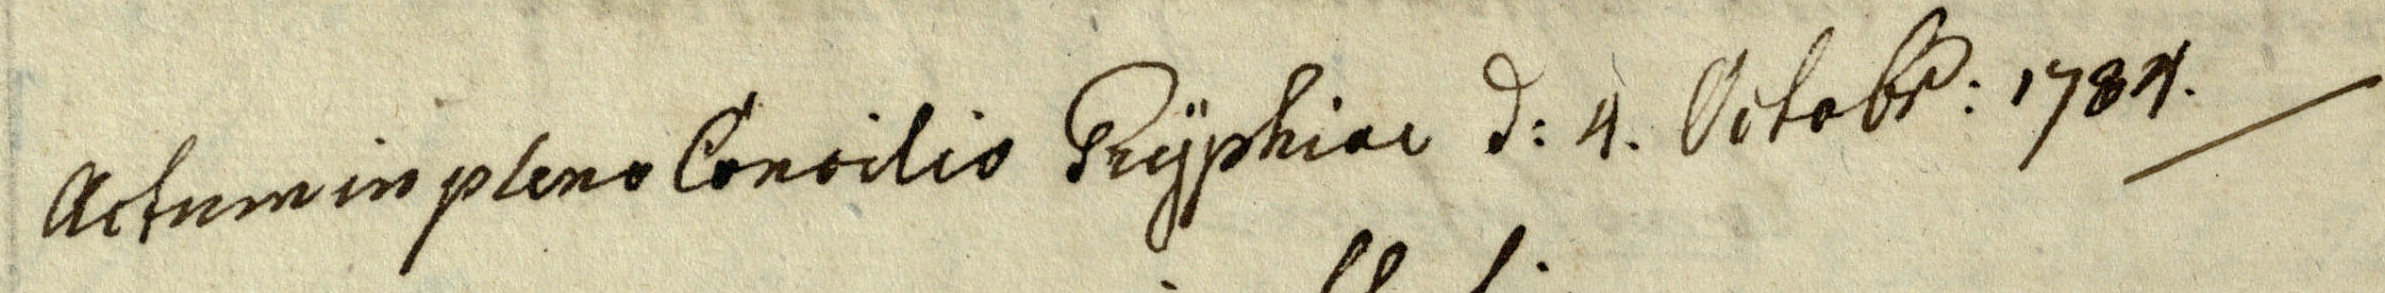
Actum in pleno Concilio Grÿphiae d. 4. Octobr. 1784
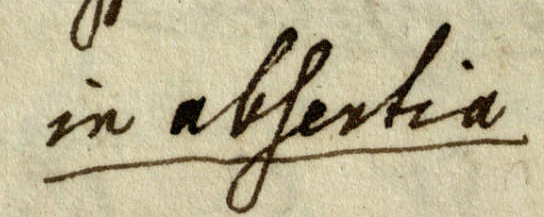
in absentia
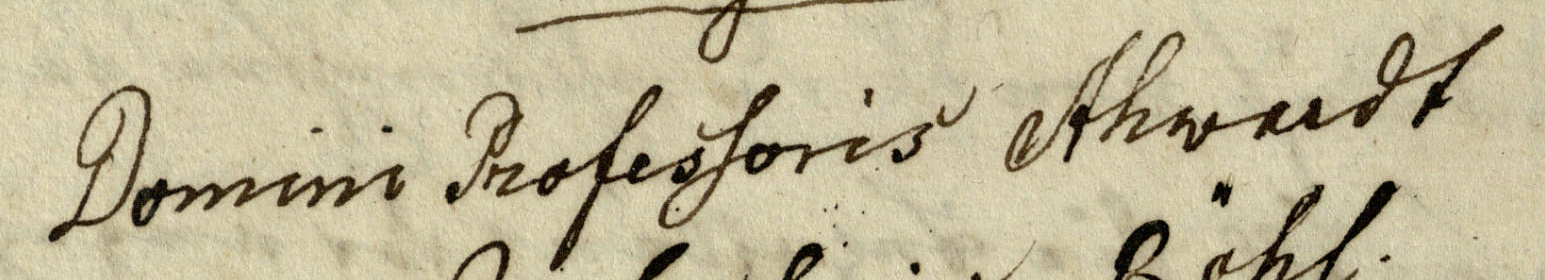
Domini Professoris Ahwardt
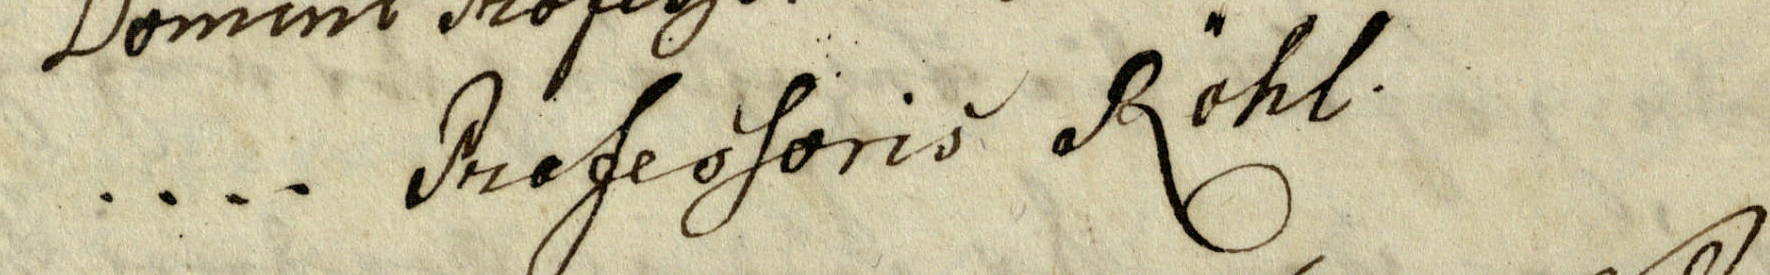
Professoris Röhl.
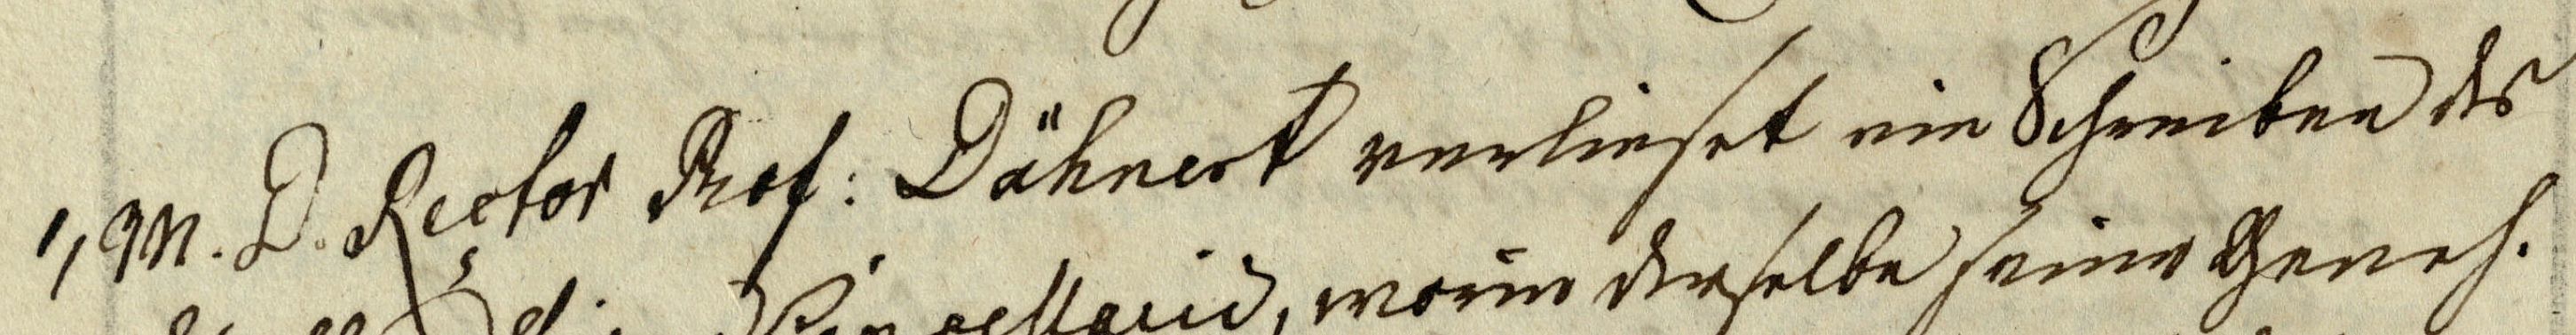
1, M. D. Rector Prof. Dähnert verlieset ein Schreiben des
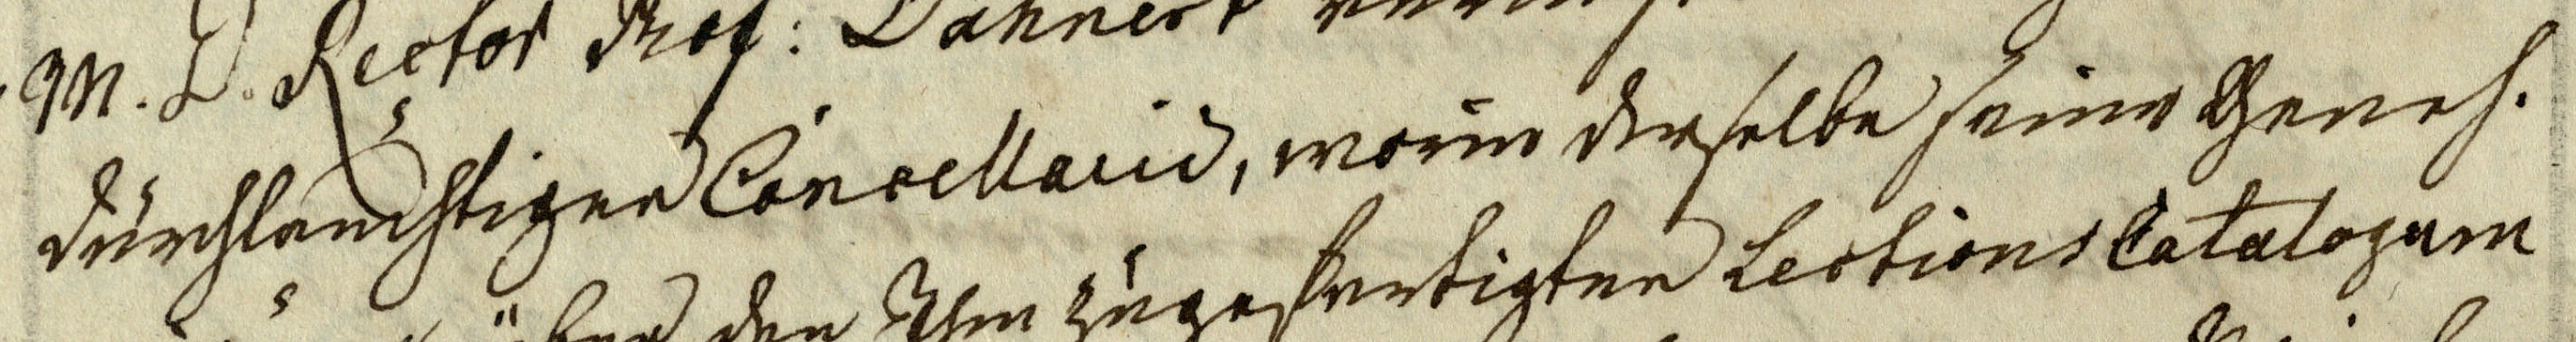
Durchlauchtigen Cancellarii, worin derselbe seine Geneh¬
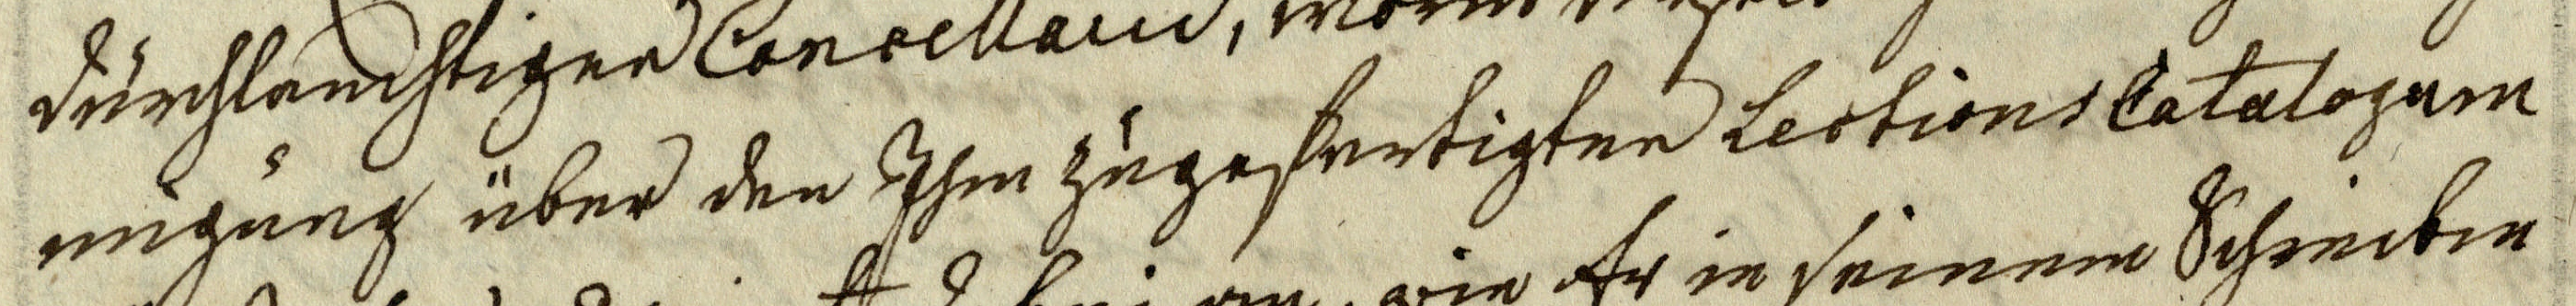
migung über den Ihm zugefertigten Lections Catalogum
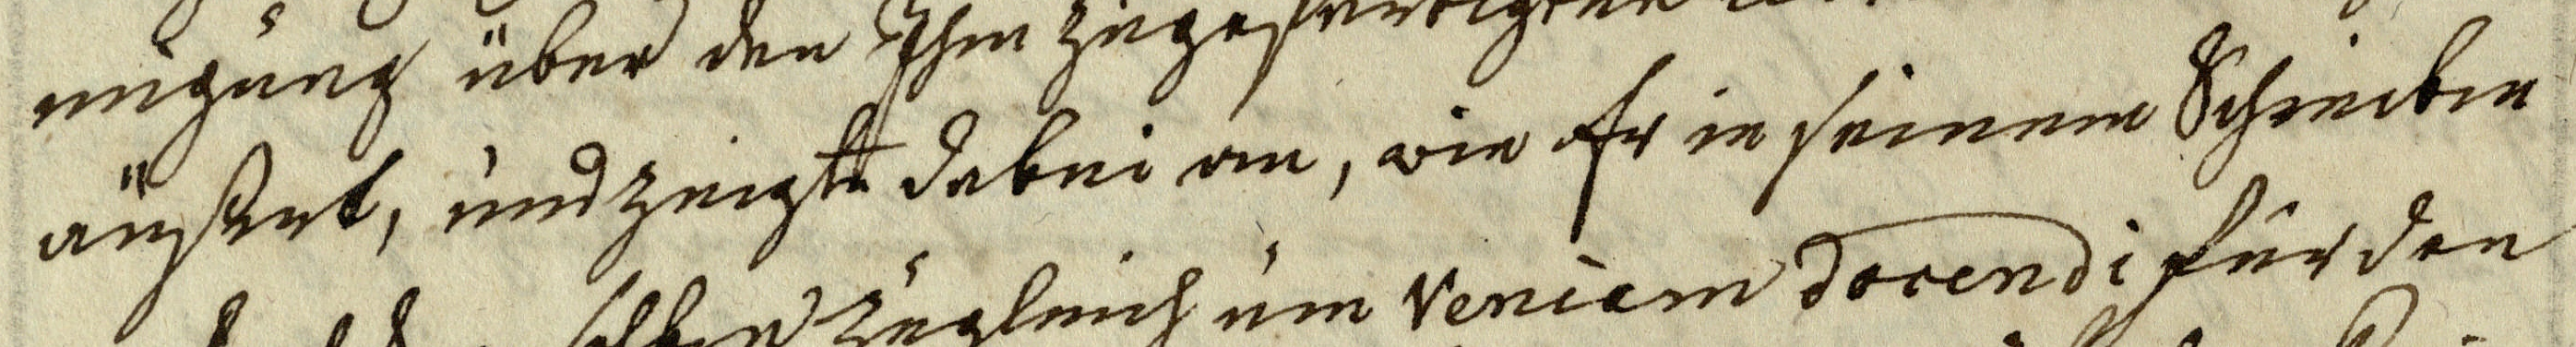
äußert, und zeigte dabei an, wie Er in seinem Schreiben
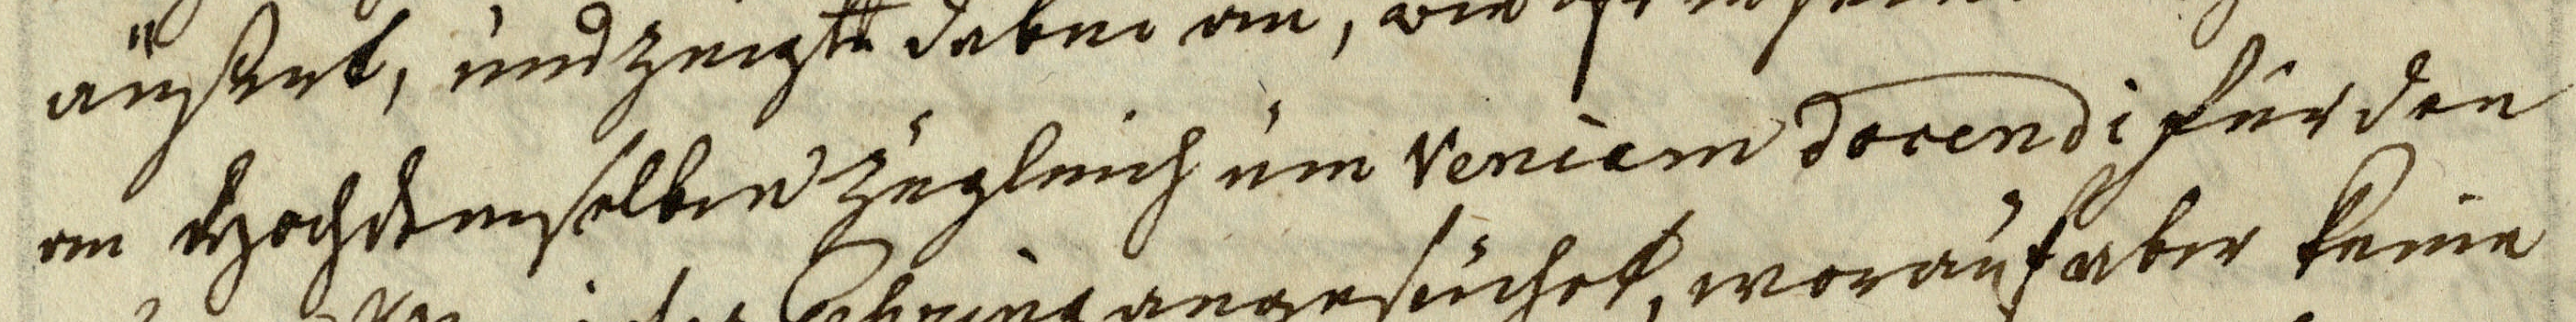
an Hochdemselben zugleich um veniam docendi für den
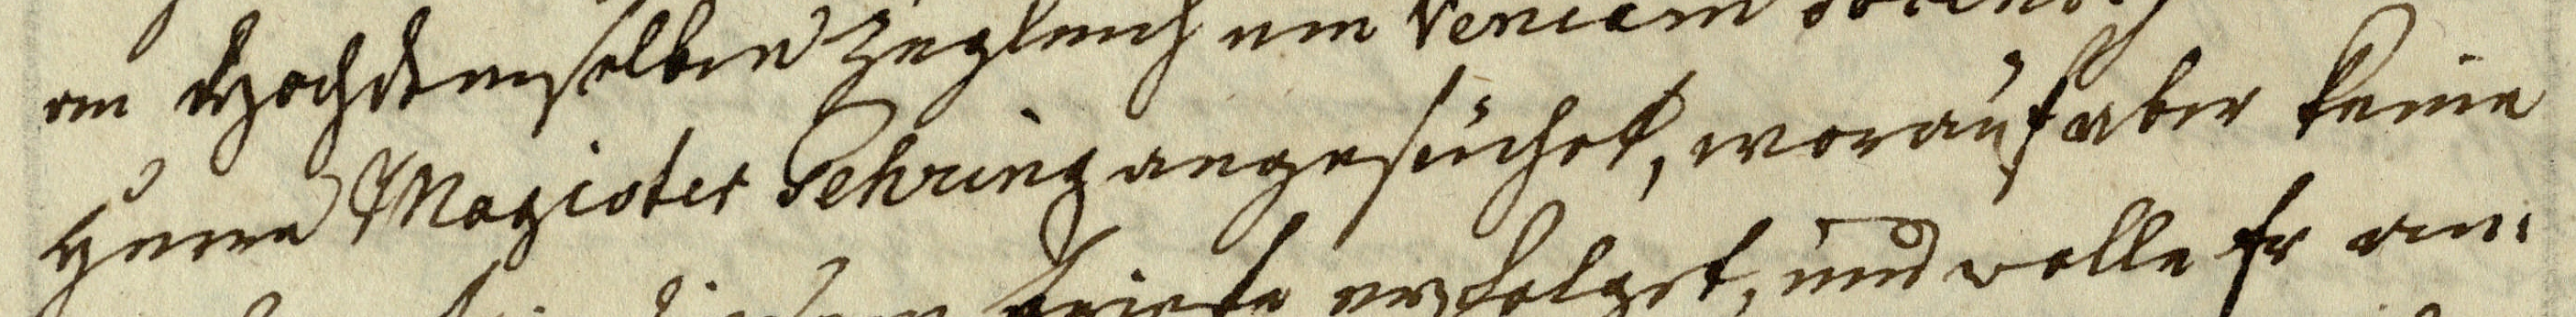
Herrn Magister Gehring angesuchet, worauf aber keine
